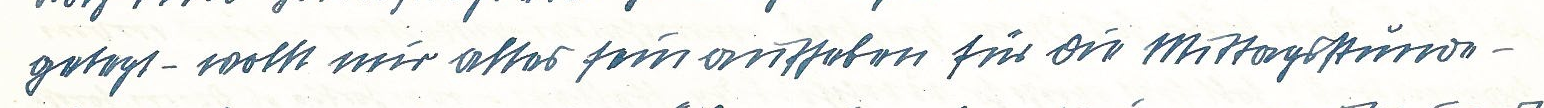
gelegt – wollt mir alles fein aufheben für die Mittagsstunde –
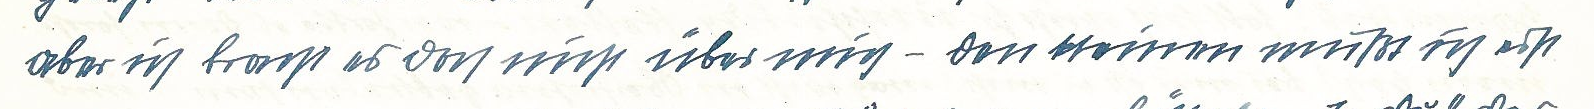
aber ich bracht es doch nicht über mich – den Kleinen mußt ich erst
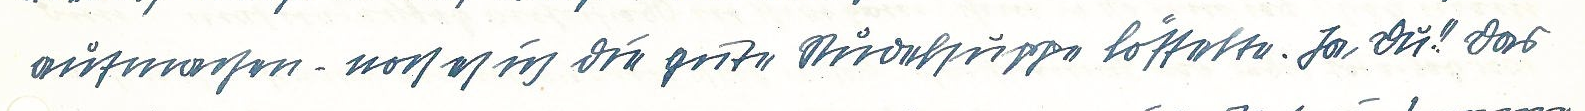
aufmachen – noch eh ich die gute Nudelsuppe löffelte. Ja, Du!! Das
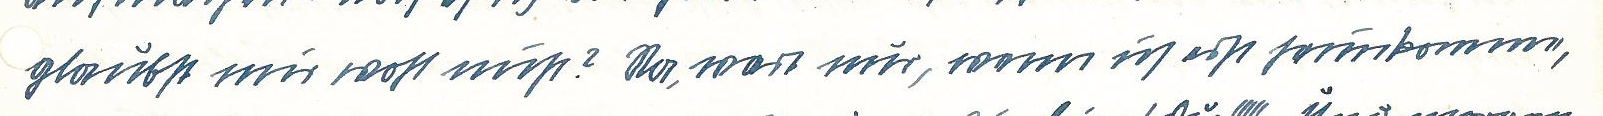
glaubst mir wohl nicht? Na, wart nur, wenn ich erst heimkomme,
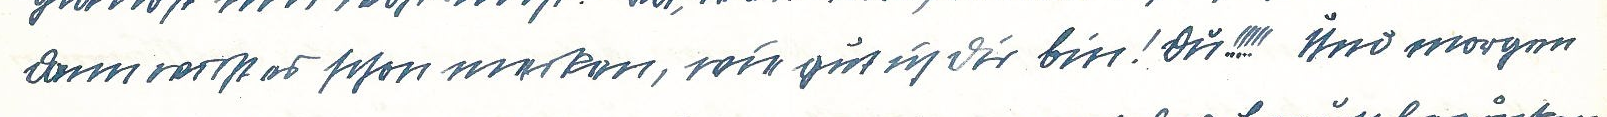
dann wirst es schon merken, wie gut ich Dir bin! Du!!!!! Und morgen
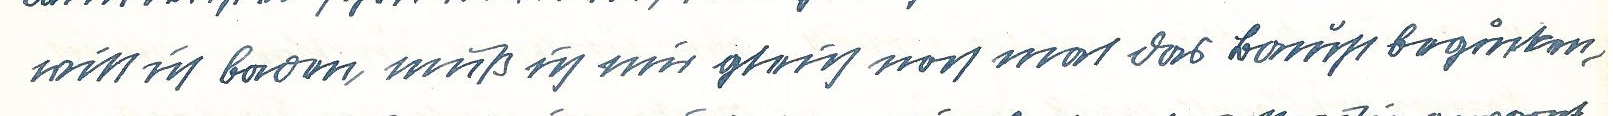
will ich baden, muß ich mir gleich noch mal das Bauchl begucken,
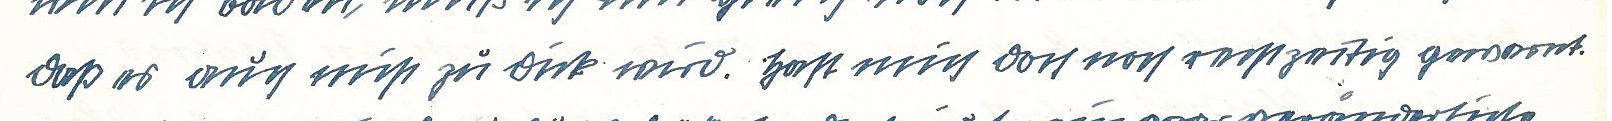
daß es auch nicht zu dick wird. Hast mich doch noch rechtzeitig gewarnt.
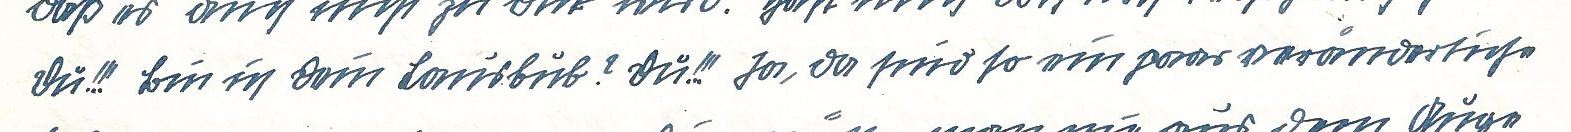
Du!!! Bin ich Dein Lausbub? Du!!! Ja, das sind so ein paar veränderliche
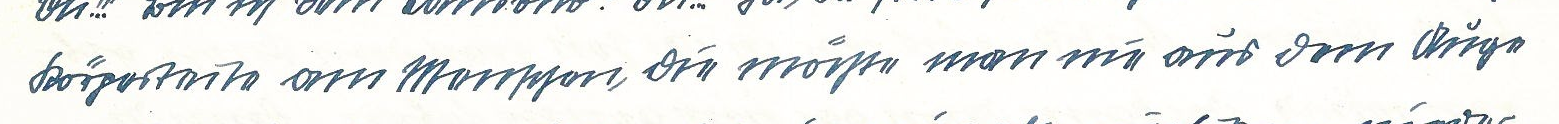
Körperteile am Menschen, die möchte man nie aus dem Auge
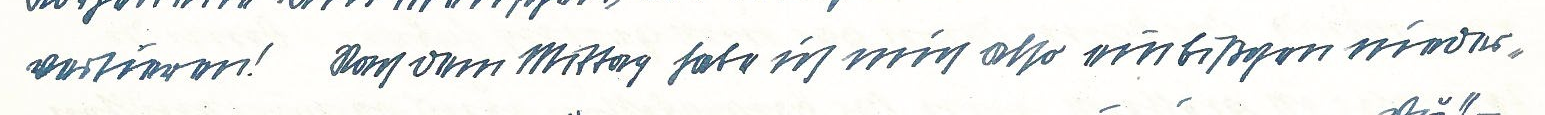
verlieren! Nach dem Mittag habe ich mich also ein bißchen nieder¬
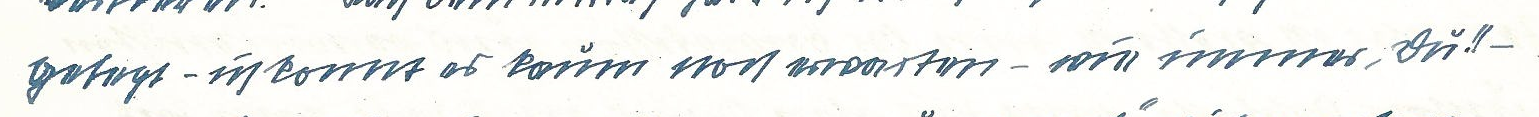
gelegt – ich konnt[‘] es kaum noch erwarten – wie immer, Du!! –
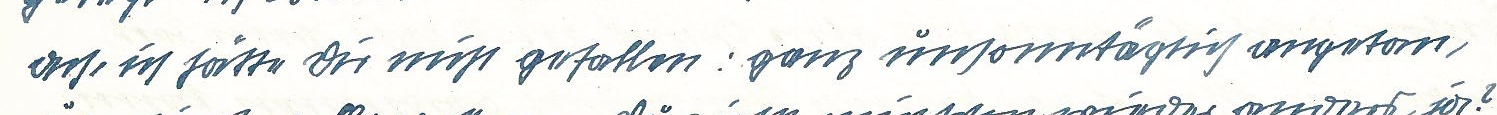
ach, ich hätte Dir nicht gefallen: ganz unsonntäglich angetan,
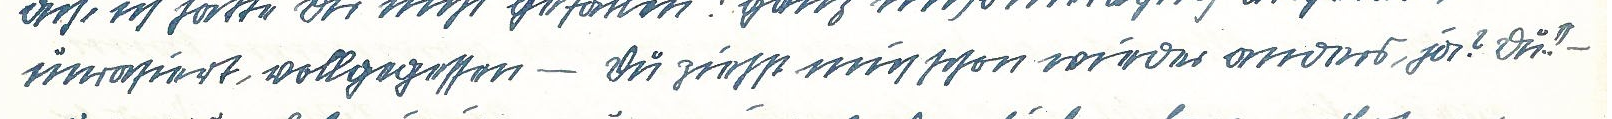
unrasiert, vollgegessen – Du siehst mich schon wieder anders, ja? Du!! –
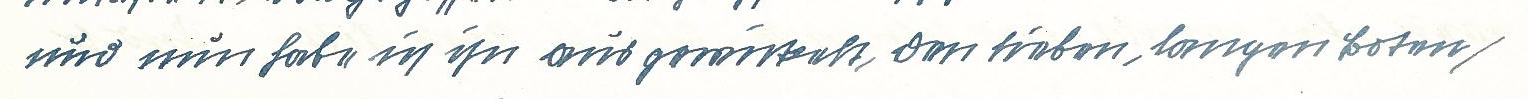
und nun habe ich ihn ausgewickelt, den lieben, langen Boten/
